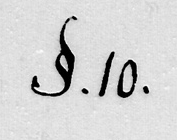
§. 10.
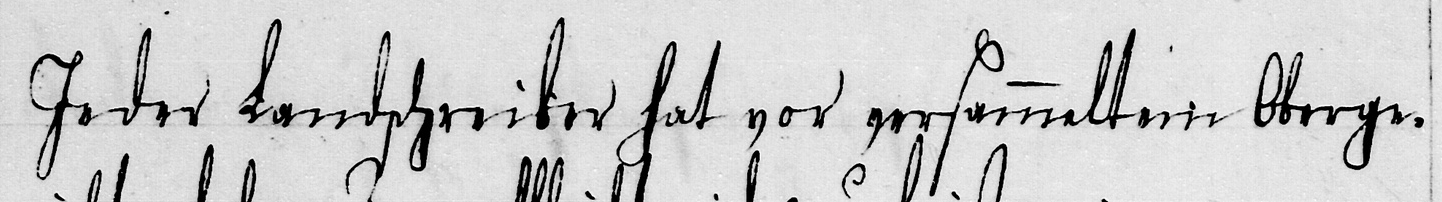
Jeder Landschreiber hat vor versammeltem Oberge¬
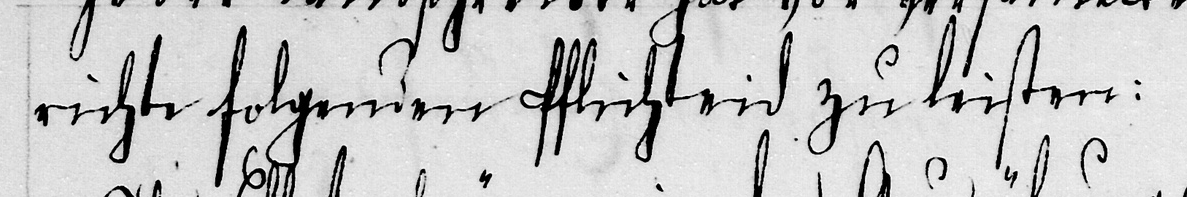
richte folgenden Pflichteid zu leisten:
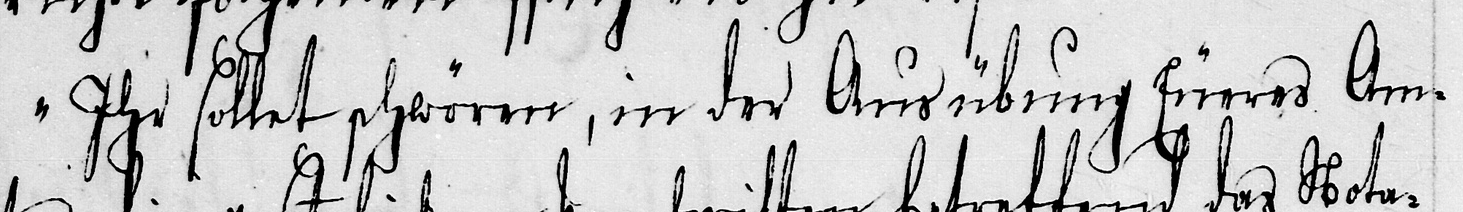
„Ihr sollet schwören, in der Ausübung Eueres Am¬
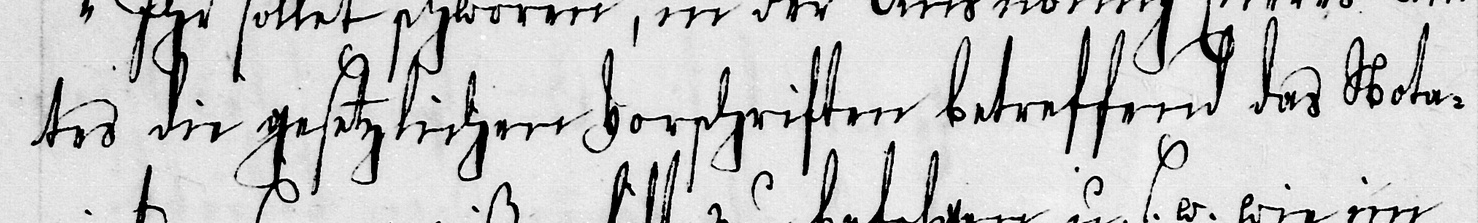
tes die gesetzlichen Vorschriften betreffend das Nota¬
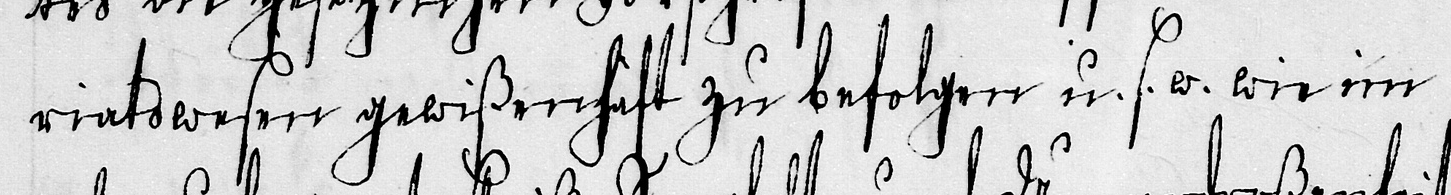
riatswesen gewißenhaft zu befolgen u. s. w. wie im
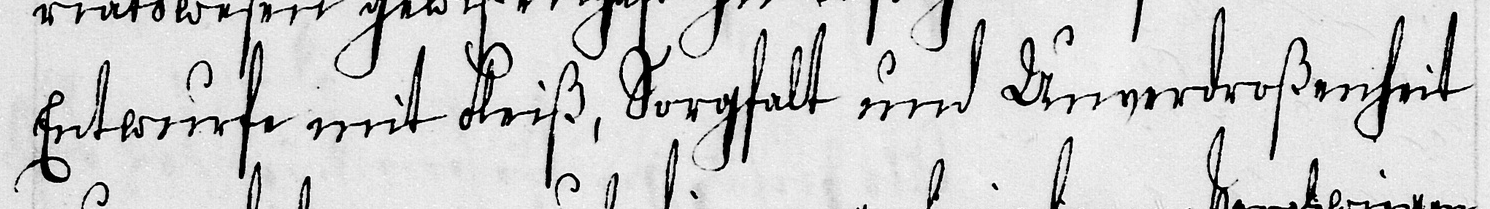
Entwurfe mit Fleiß, Sorgfalt und Unverdroßenheit
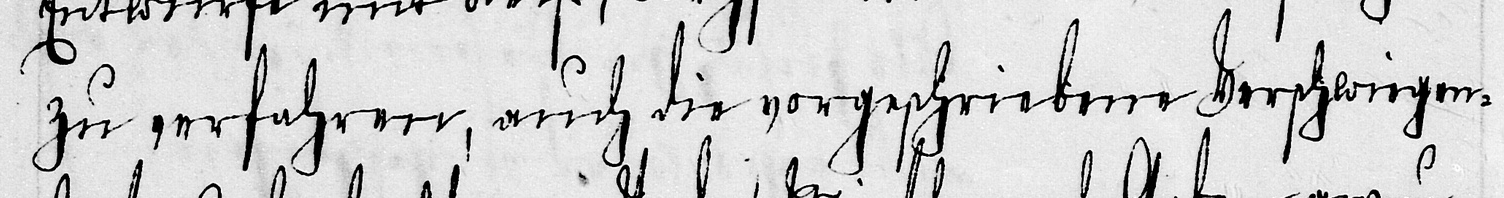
zu verfahren, auch die vorgeschriebene Verschwiegen¬
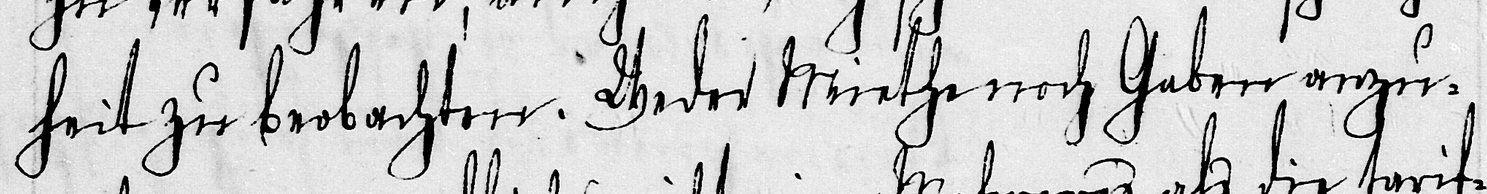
heit zu beobachten. Weder Miethe noch Gaben anzu¬
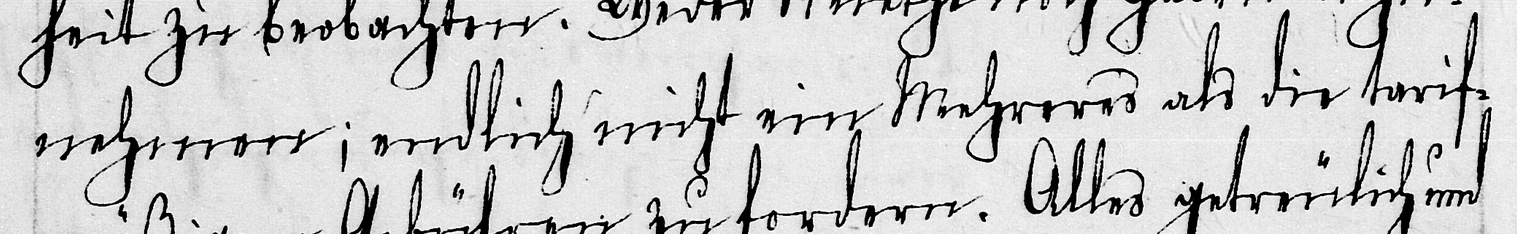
nehmen; endlich nicht ein Mehreres als die tarif¬
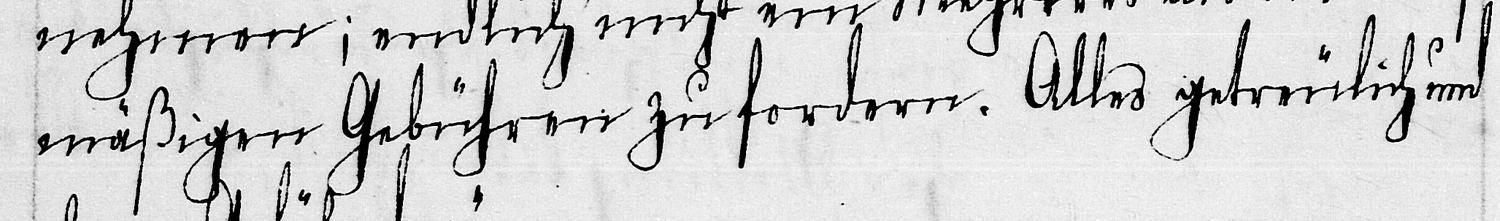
mäßigen Gebühren zu fordern. Alles getreulich und
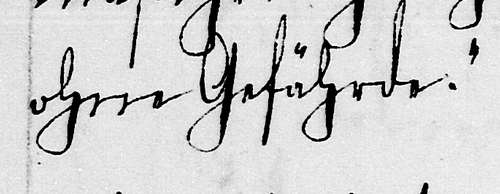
ohne Gefährde.“
